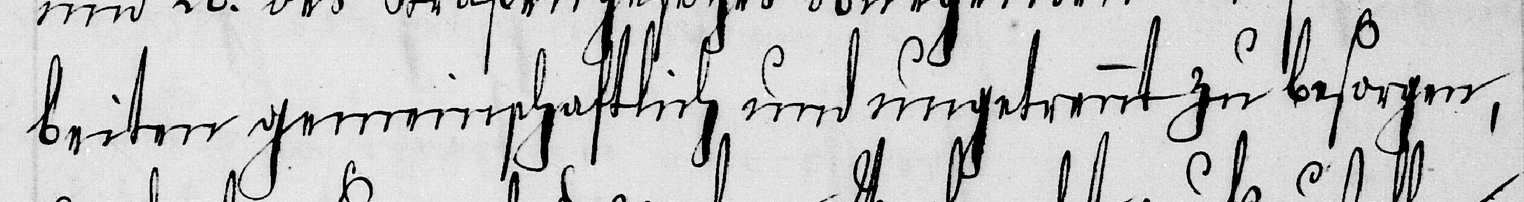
beiten gemeinschaftlich und ungetrennt zu besorgen,
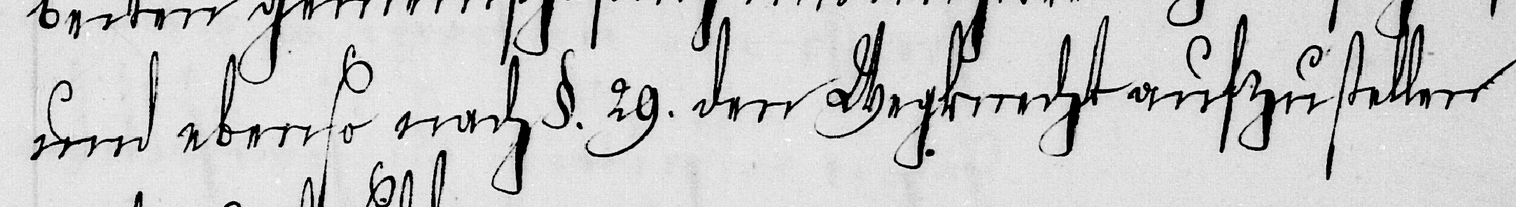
und ebenso nach §. 29. den Wegknecht aufzustellen
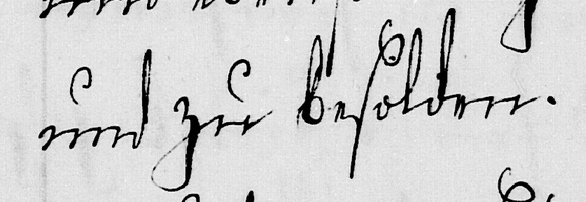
und zu besolden.
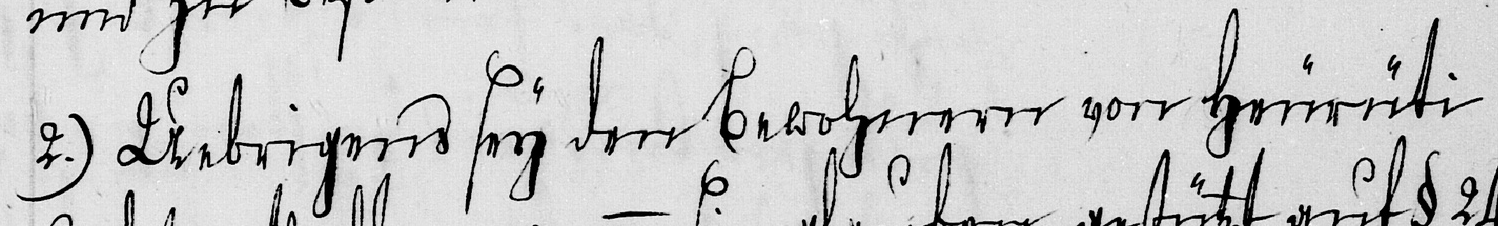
2.) Uebrigens sey den Bewohnern von Heurüti
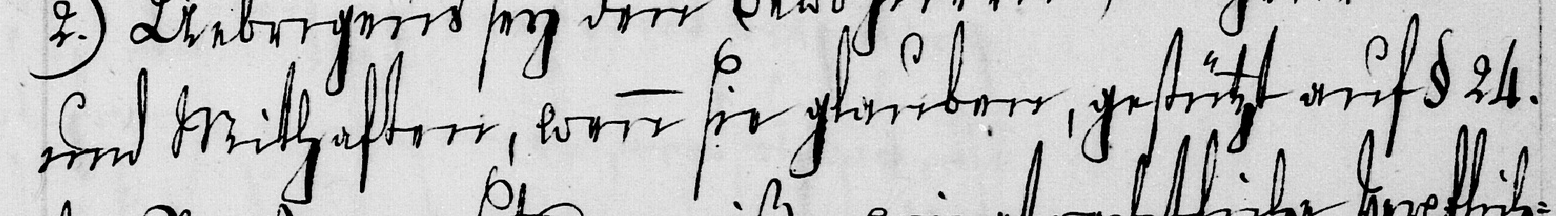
und Mithaften, wenn sie glauben, gestützt auf § 24.
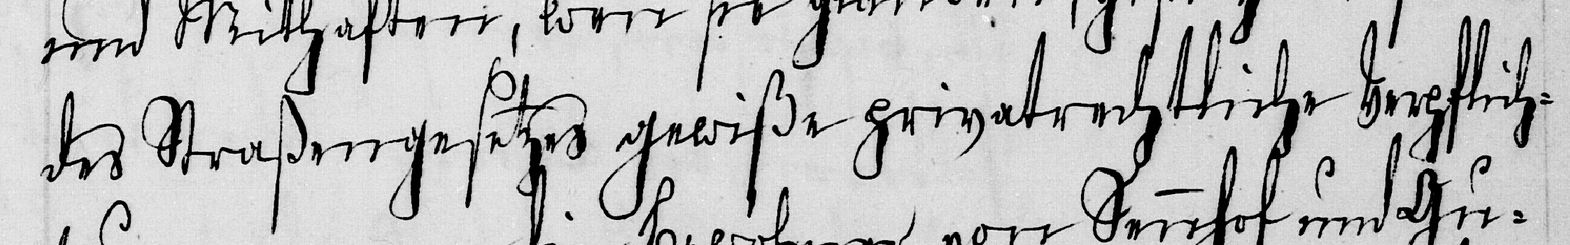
des Straßengesetzes gewiße privatrechtliche Verpflich¬
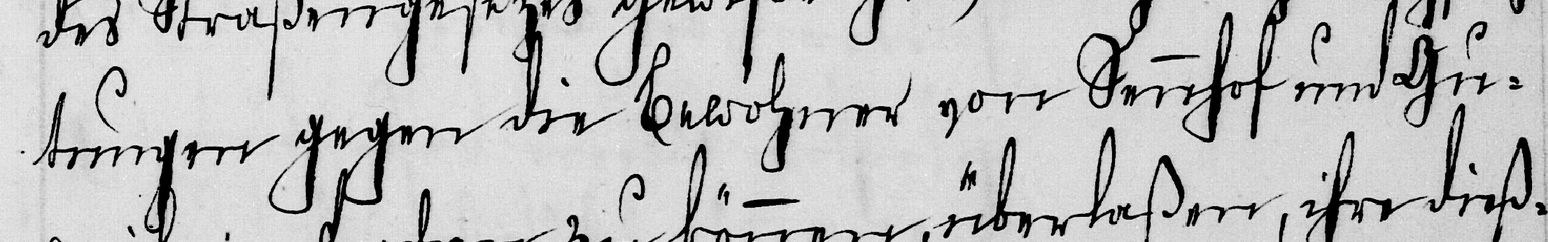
tungen gegen die Bewohner von Sennhof und Gu¬
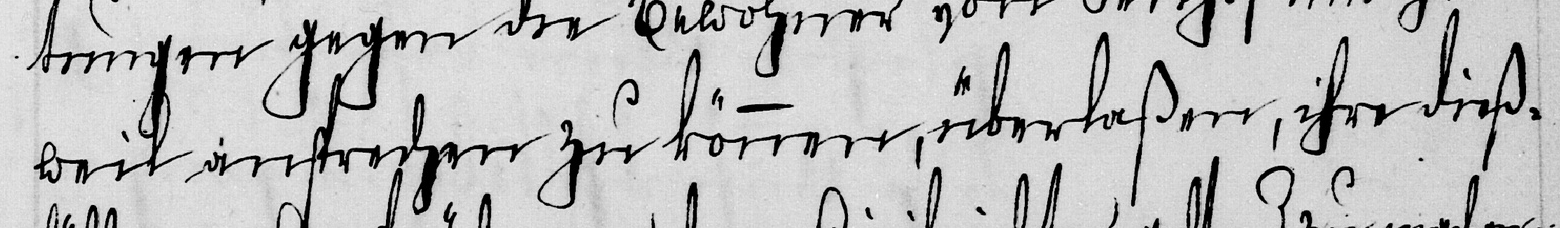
weil ansprechen zu können, überlaßen, ihre dieß¬
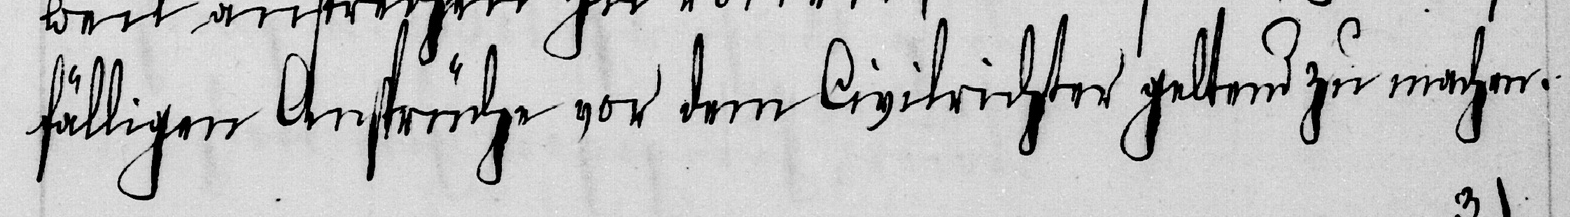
fälligen Ansprüche vor dem Civilrichter geltend zu machen.
